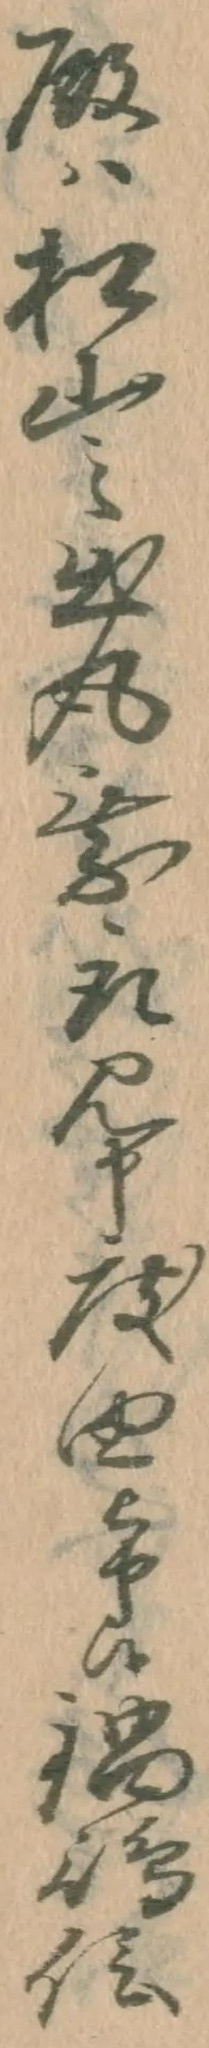殿は松山之出丸乗取見申度由被申候鍋島信
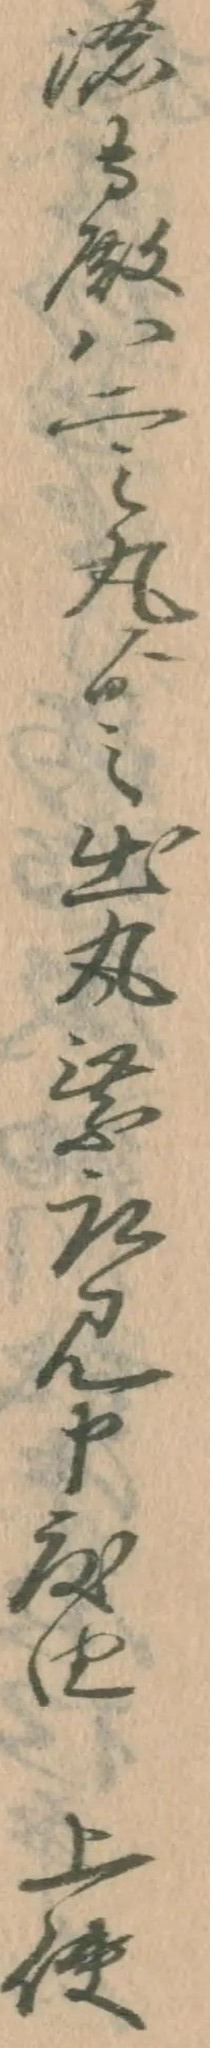濃守殿は二之丸ゟ之出丸乗取見申度由上使
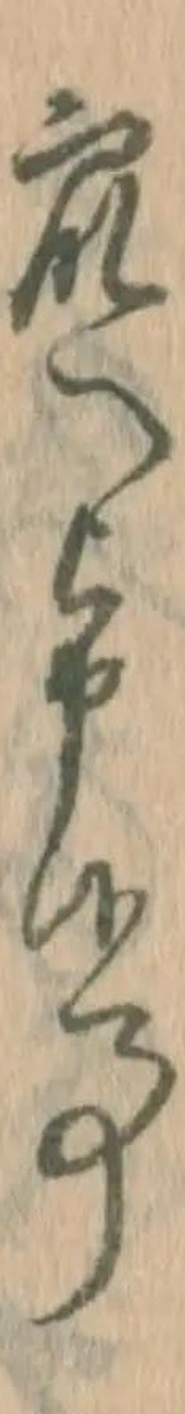衆へ被申候事
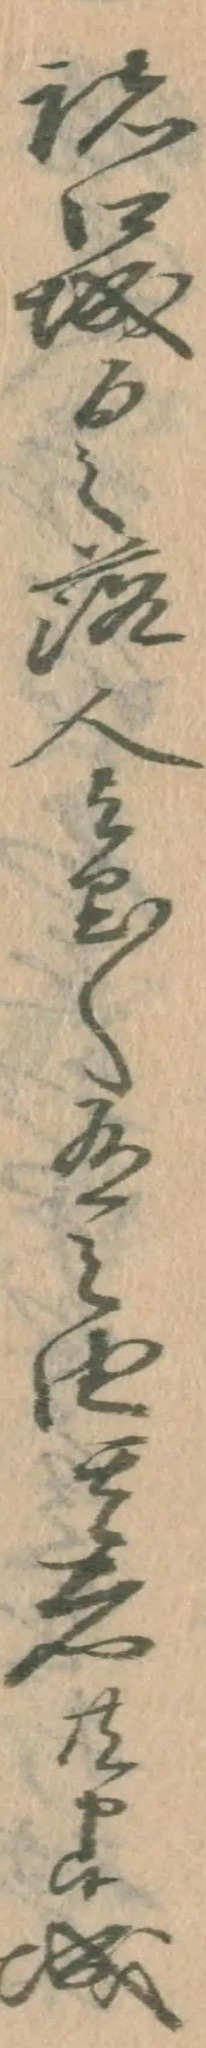一諸口城ゟ之落人与里〳〵有之由其者共申候城
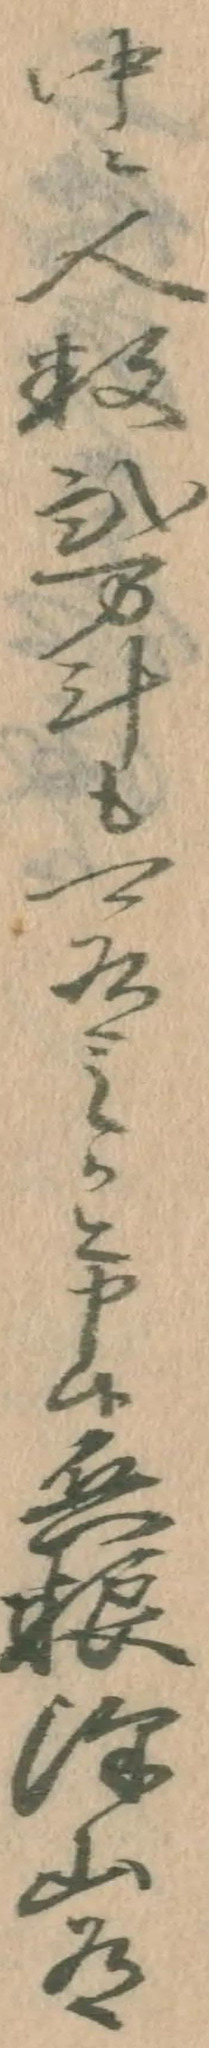中に人数弐万斗も可有之かと申候兵粮沢山有
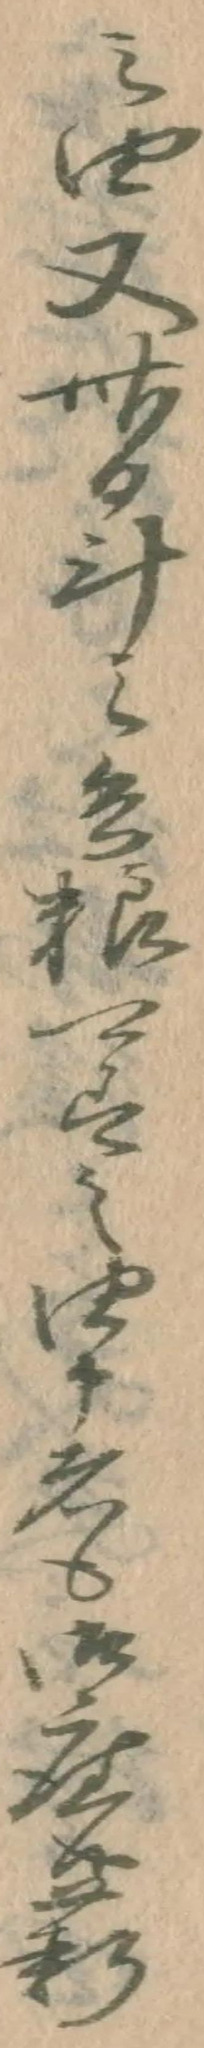之由又丗日斗之兵粮可尽之由申者も御座候薪
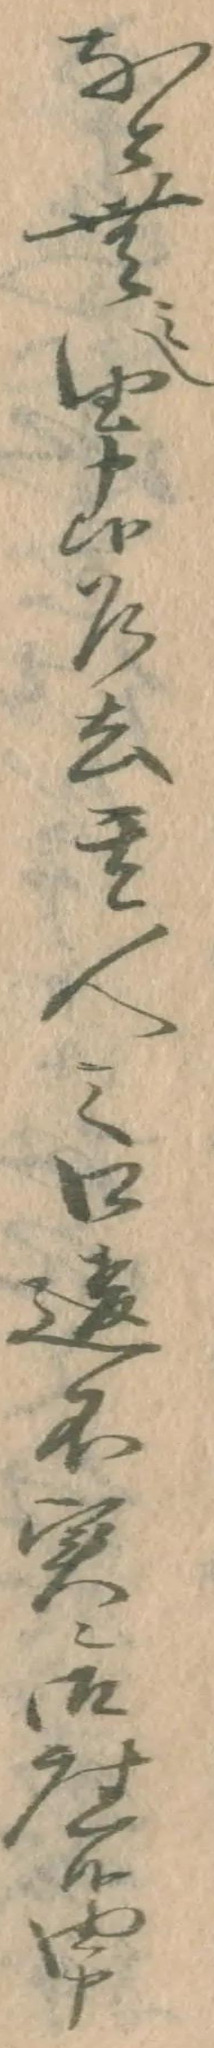なと無之由申候道去其人之口違不実に御座候由申
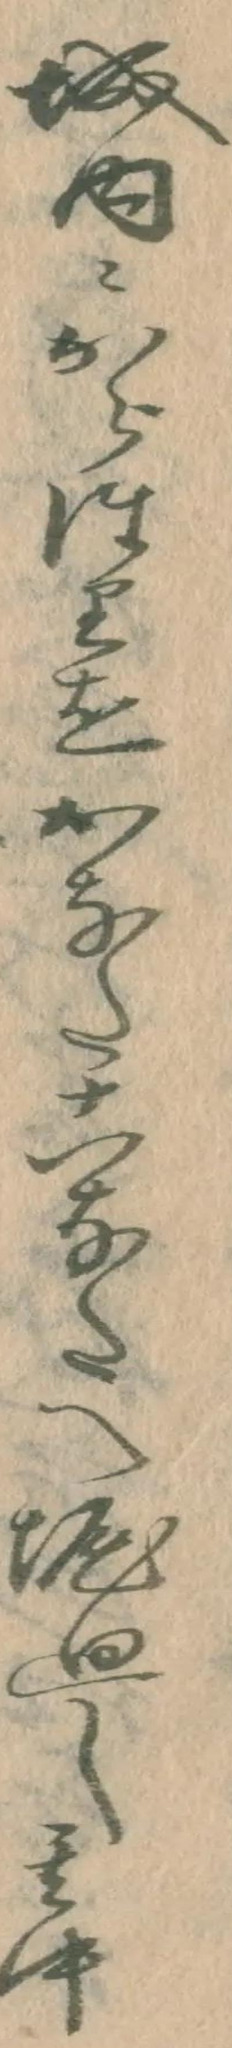一城内にからほ里をかなた古なたへ堀廻し其中
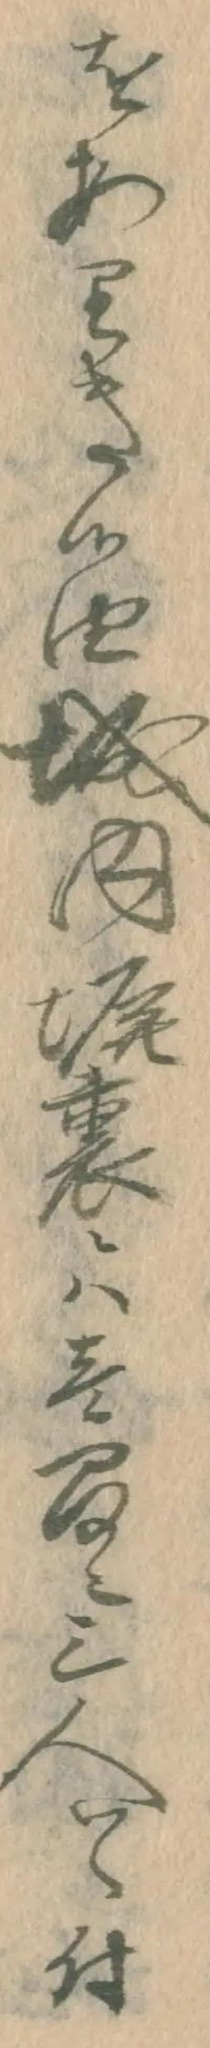をあ里き候由城内塀裏には壱間之三人つゝ付

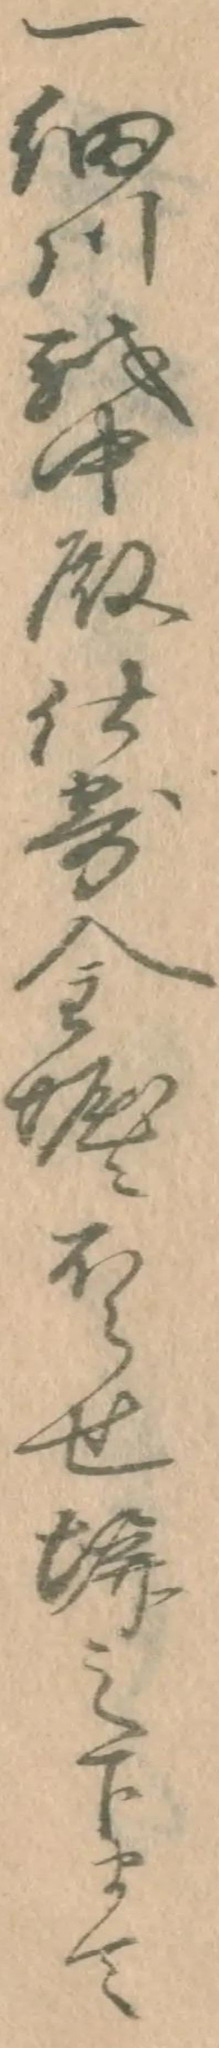一細川越中殿仕寄金堀に不らせ塀之下まて
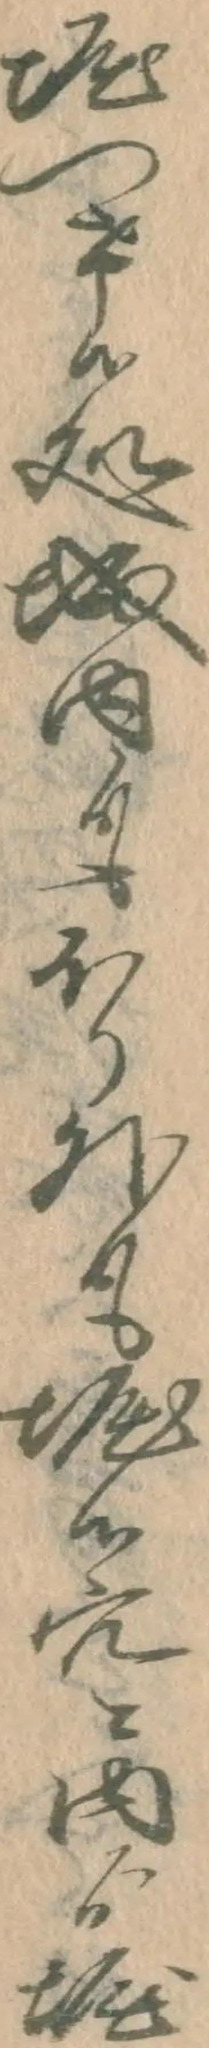堀つ希候処城内ゟも不り外にも堀候穴と内ゟ堀
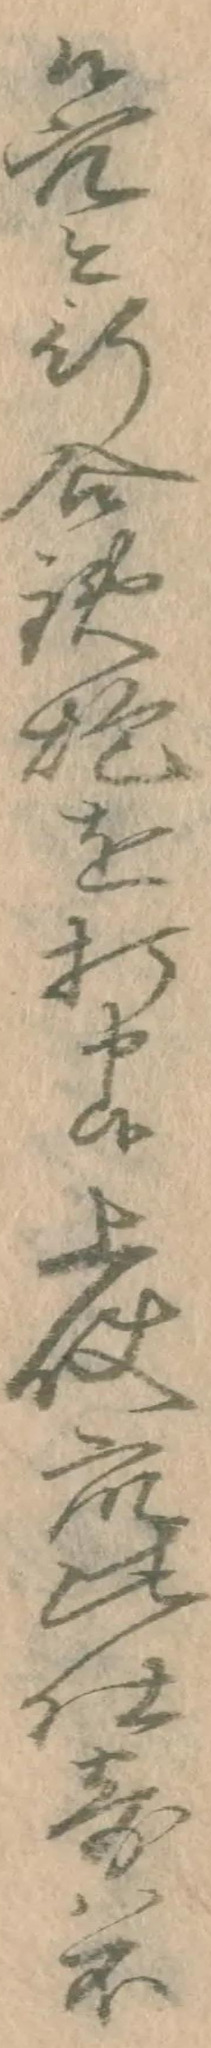候穴と行合鉄炮を打申候上使衆此仕寄は不
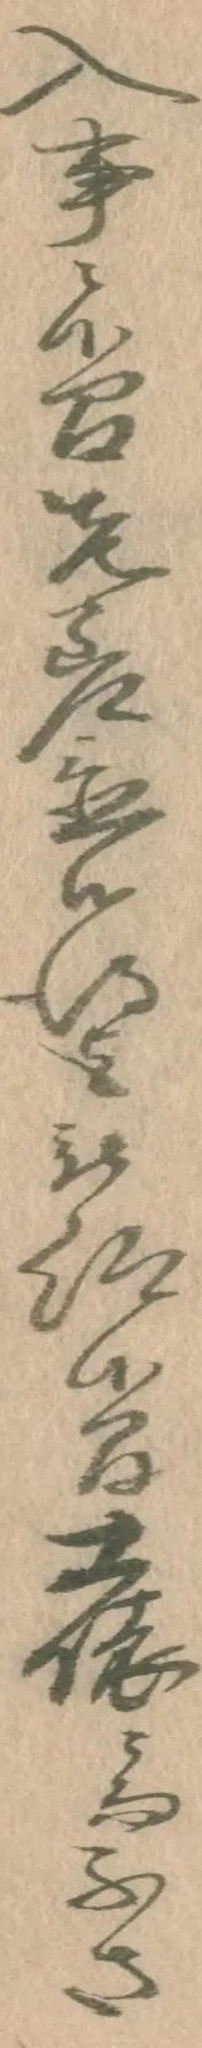入事に候間先差置候得者被仰候間土俵に而ふさ
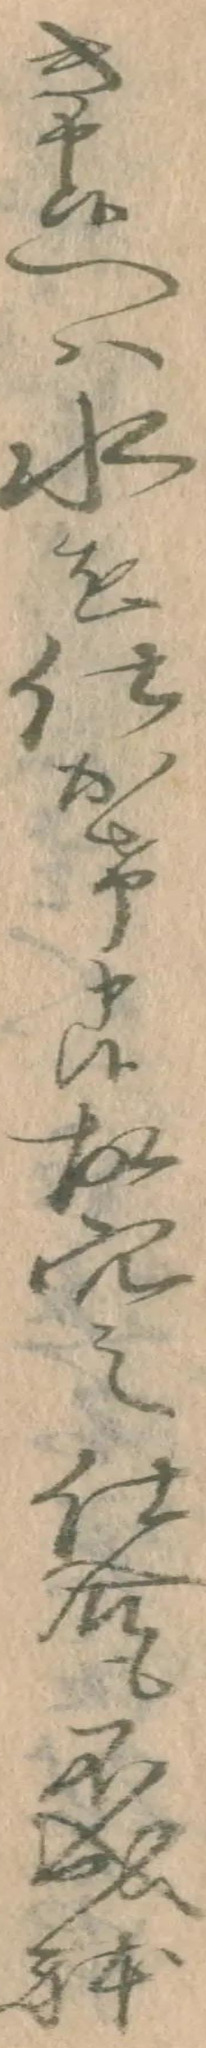き申候へは水を仕か希申候故穴之仕合も不成躰
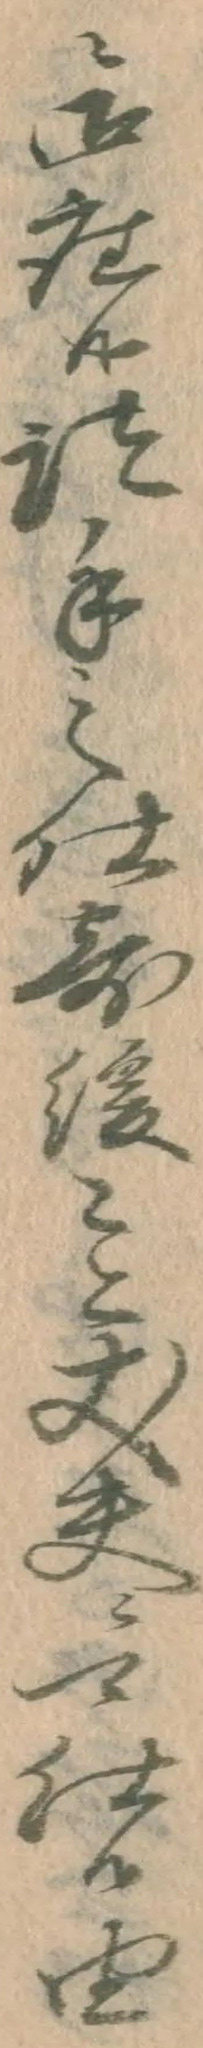に御座候諸手之仕寄後こと丈夫に可仕候由
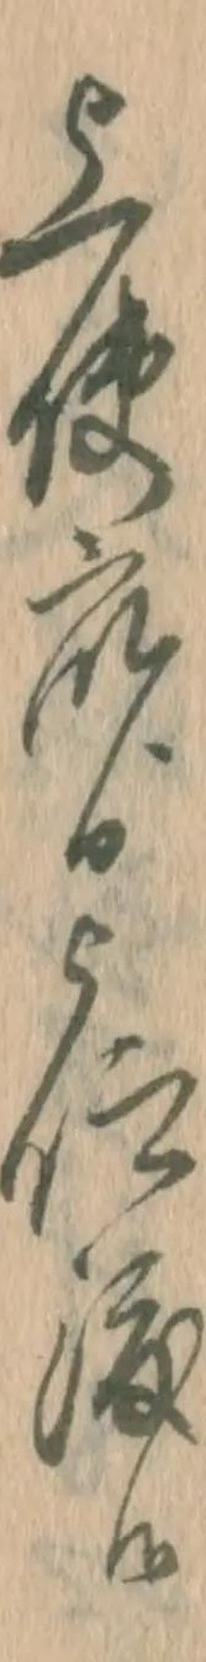上使衆ゟ被仰渡候
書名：切支丹御退治記 49巻. [6]
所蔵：国立国会図書館 National Diet Library, JAPAN
